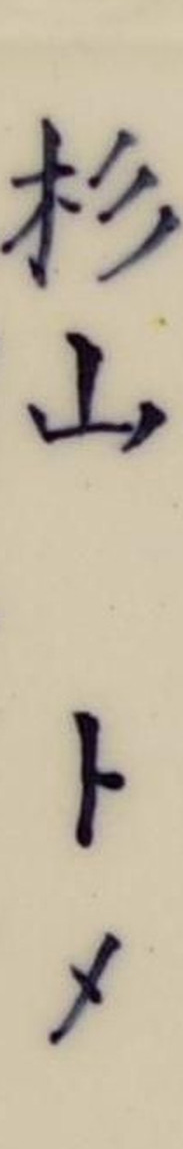杉山トメ
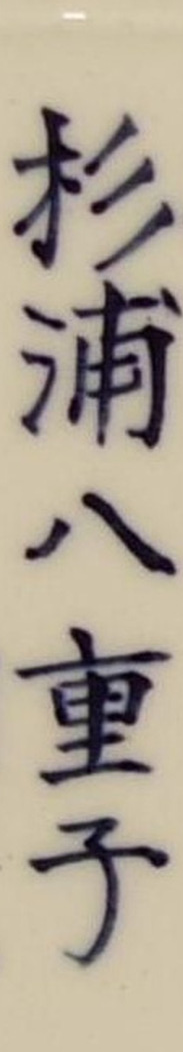杉浦八重子
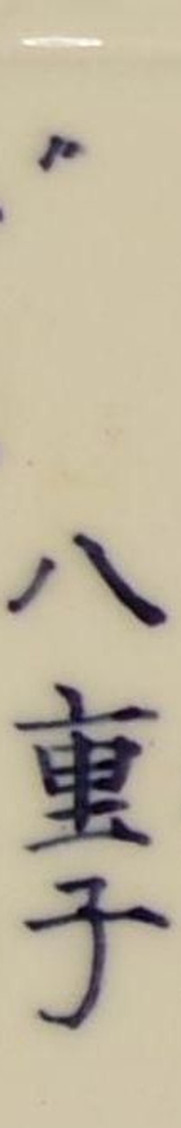八重子
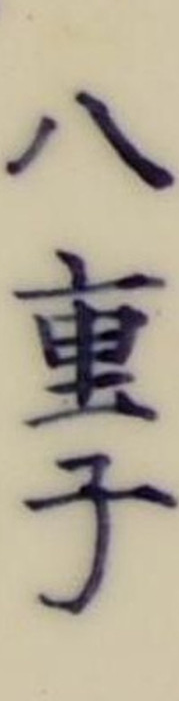八重子
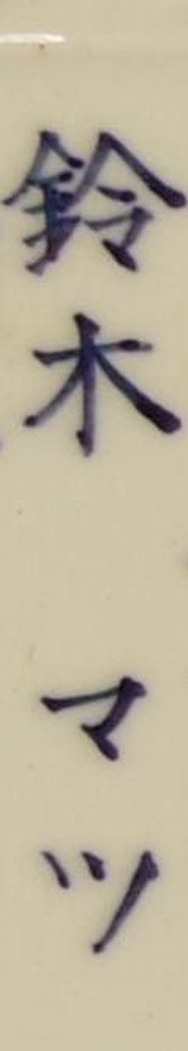鈴木マツ

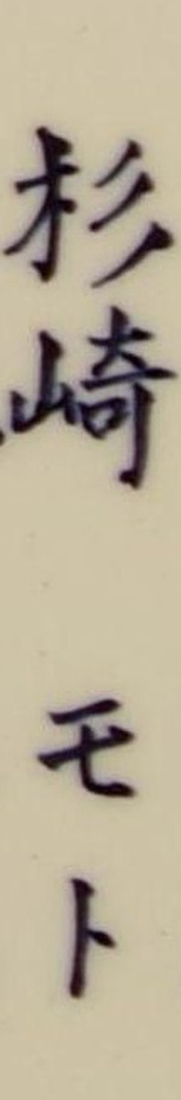杉崎モト
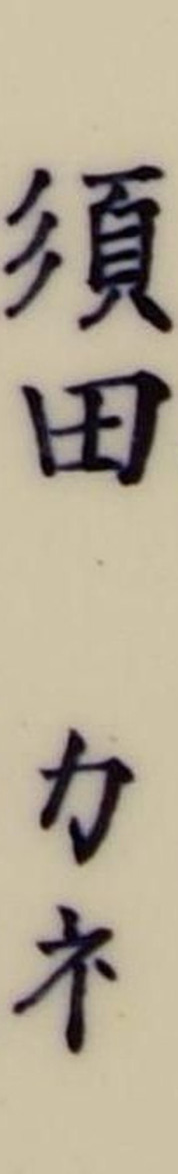須田カネ
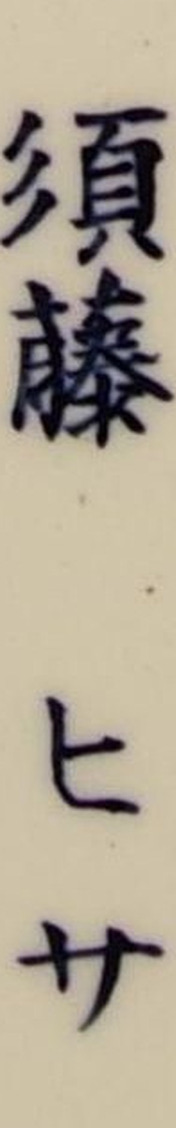須藤ヒサ
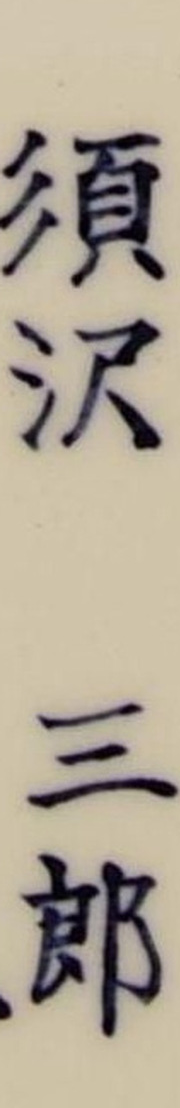須澤三郎
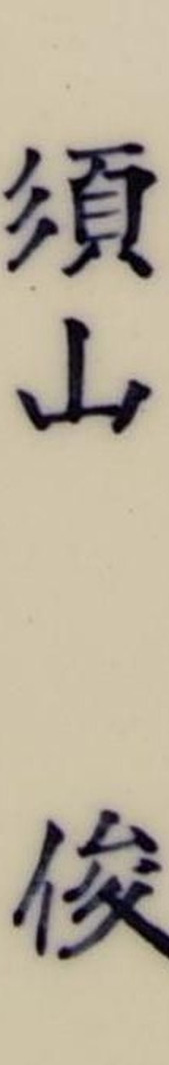須山俊
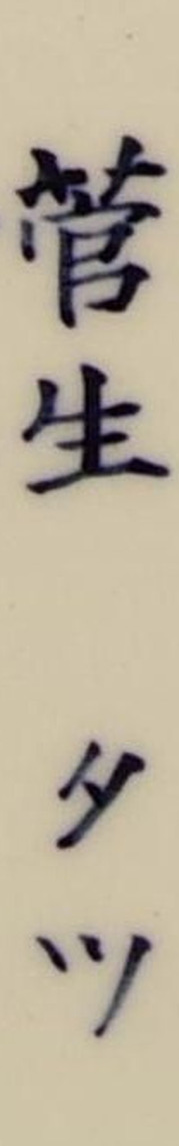管生タツ
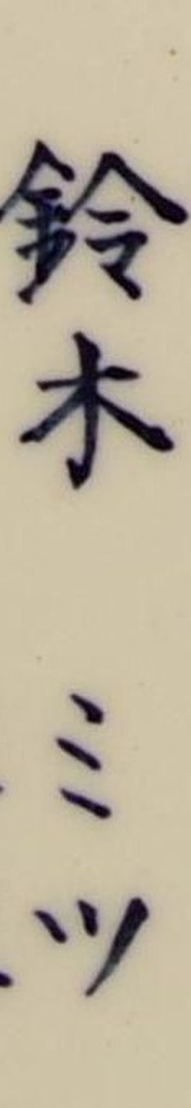鈴木ミツ
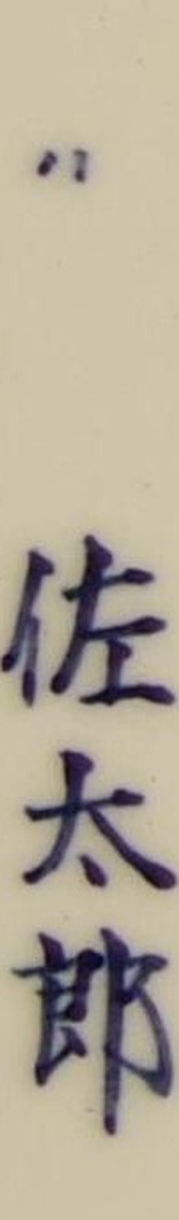佐太郎
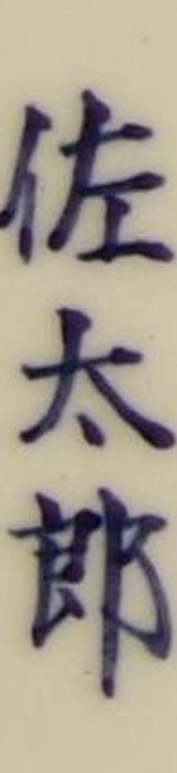佐太郎
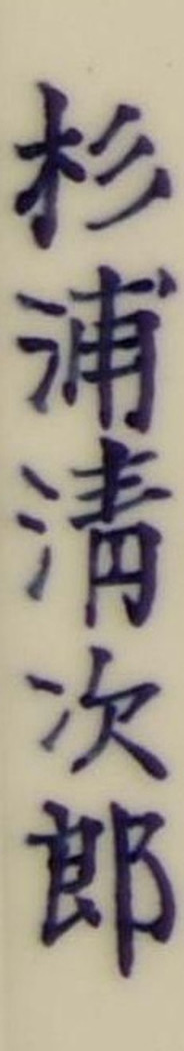松浦清次郎

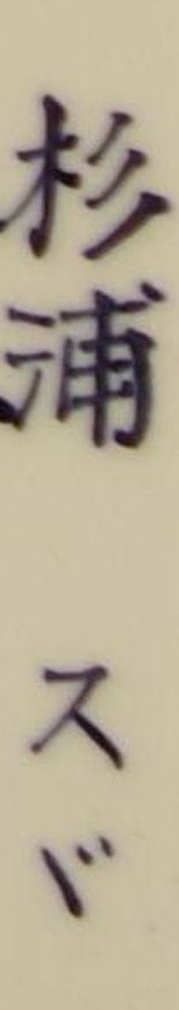杉浦スヾ
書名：E~L
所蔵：高野山金剛峯寺
